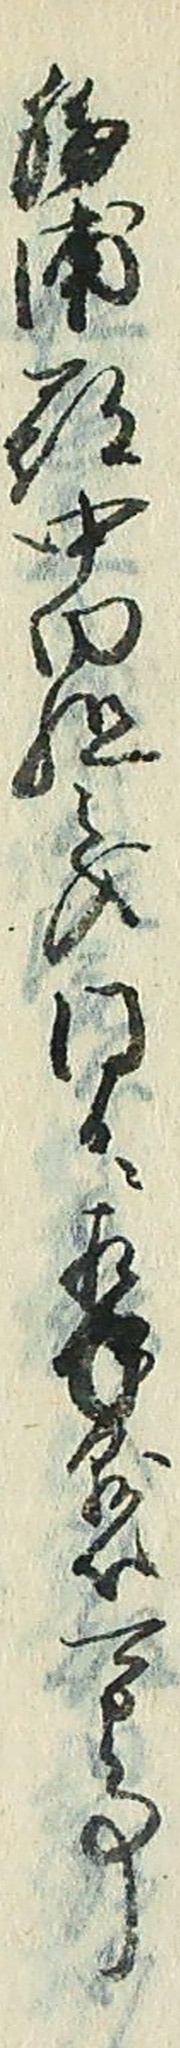勝浦郡中田組之義同日ニ相手懸可申事
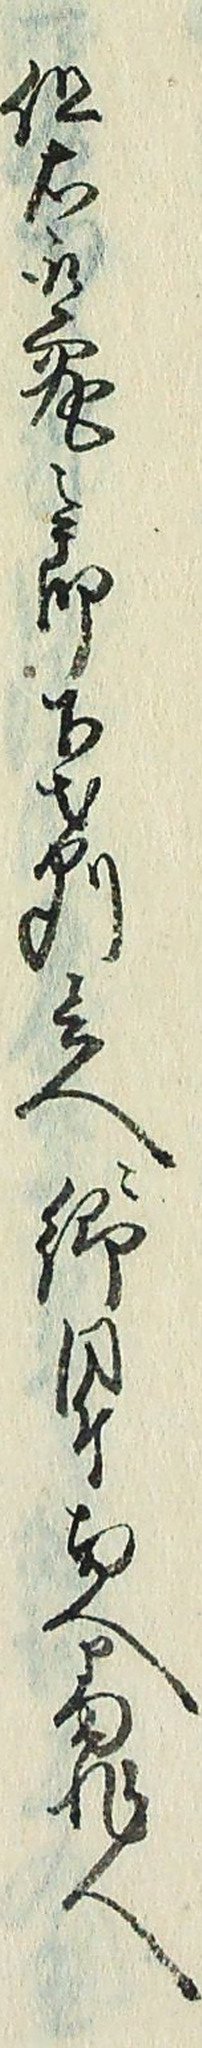但右取究之節下才判壱人ニ郷目付両人番非人
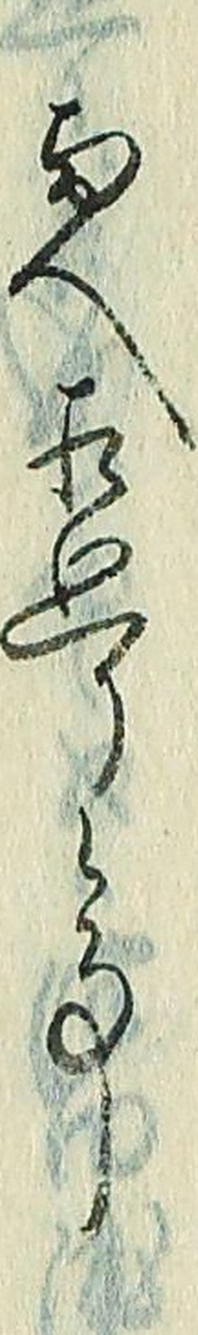両人相廻り候事
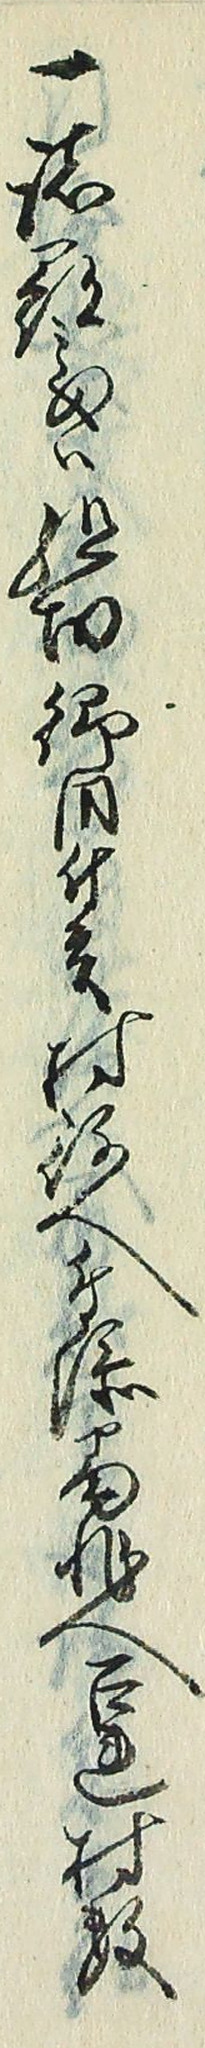一諸郡之義ハ組切郷目付共村役人付添番非人召連村数
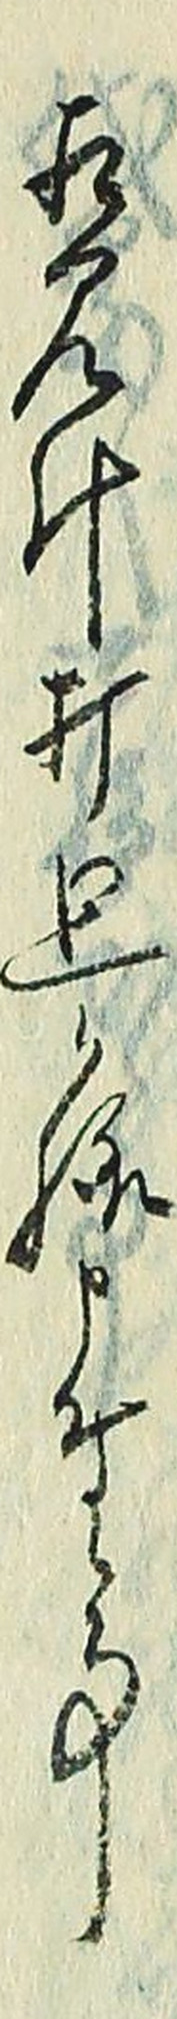相見計打廻候様申付候事
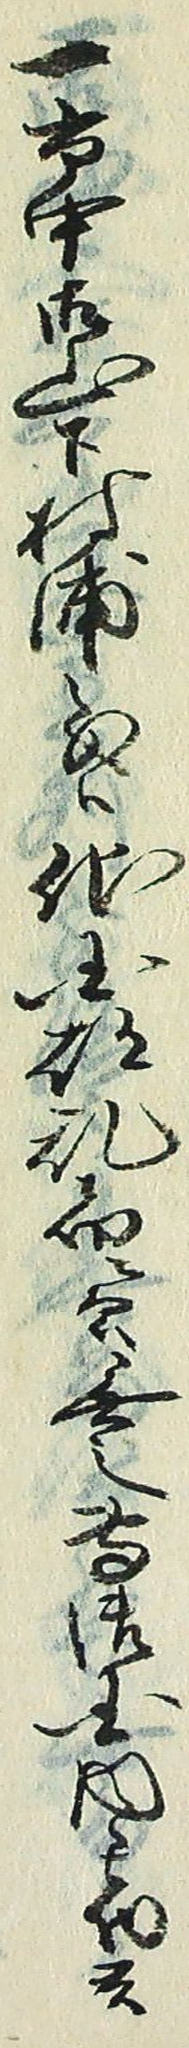一市中御山下村浦之義ハ他国胡乱者ニ而ハ無之専御国内之者共
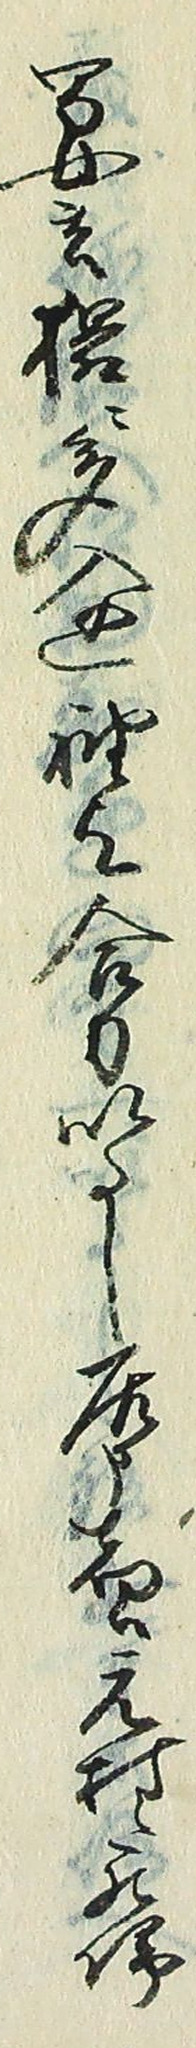男女共猥ニ多入込袖乞合力いたし居申者ハ元村へ罷帰
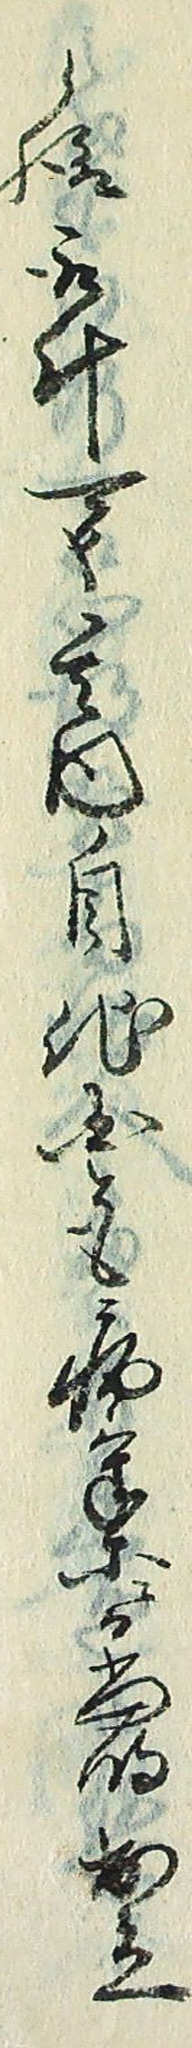候様取計可申其内自他国とも病気等ニ而當時出立
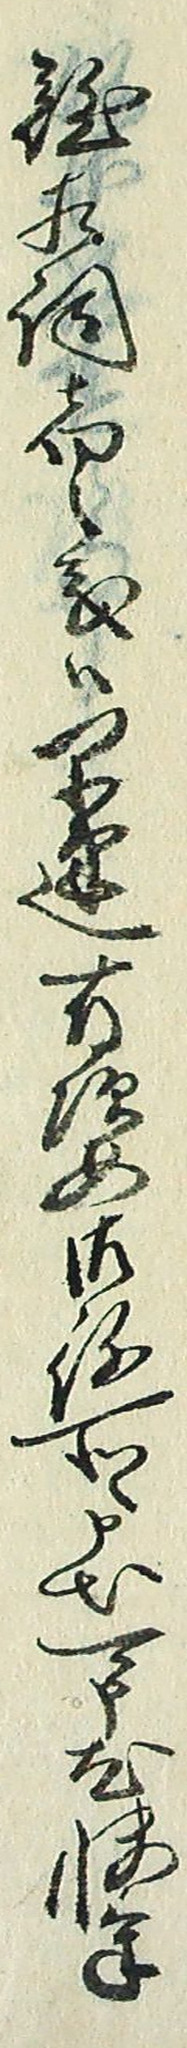難相調者之義ハ早速有姿御役所へ申出可申尤快気
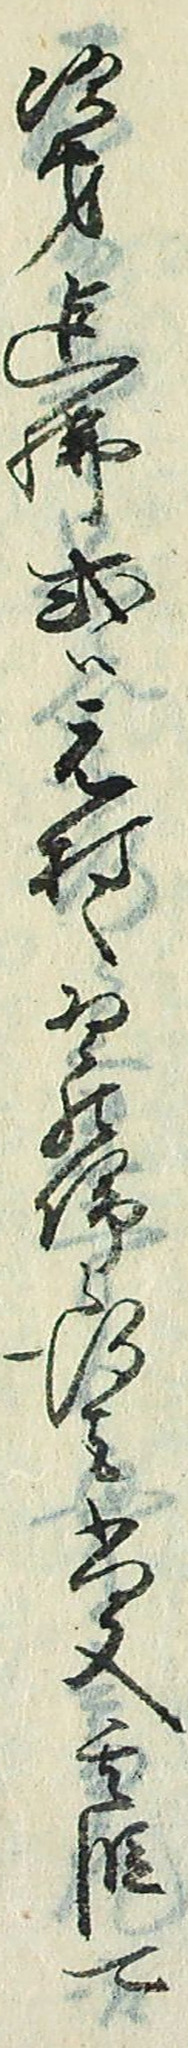次第追拂或ハ元村へ為罷帰候得者尚又其段可
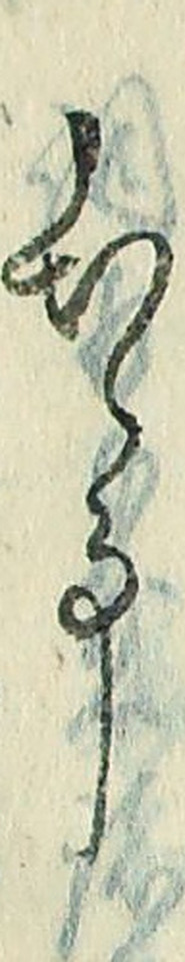申出候事
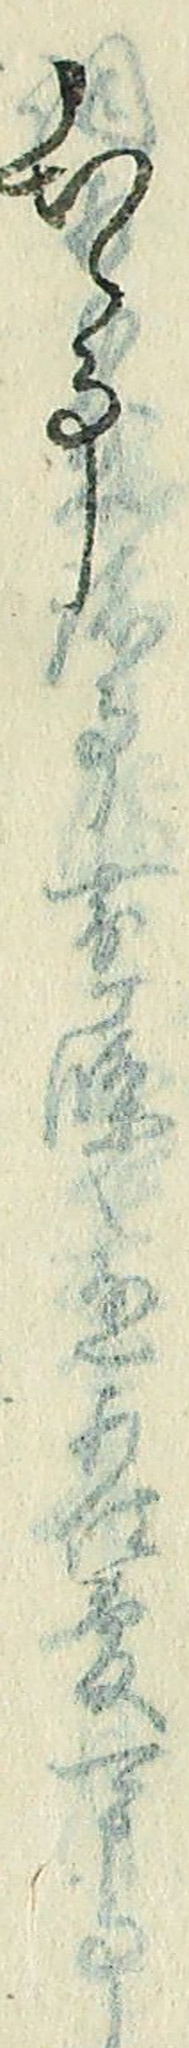申出候事
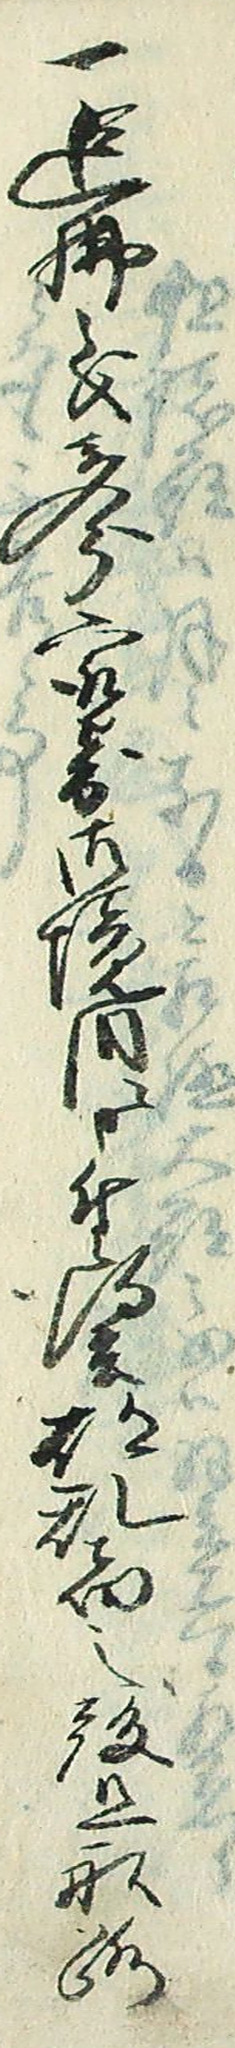一追拂之義多分最寄御境目ニ申付候得共胡乱者之趣且舩路

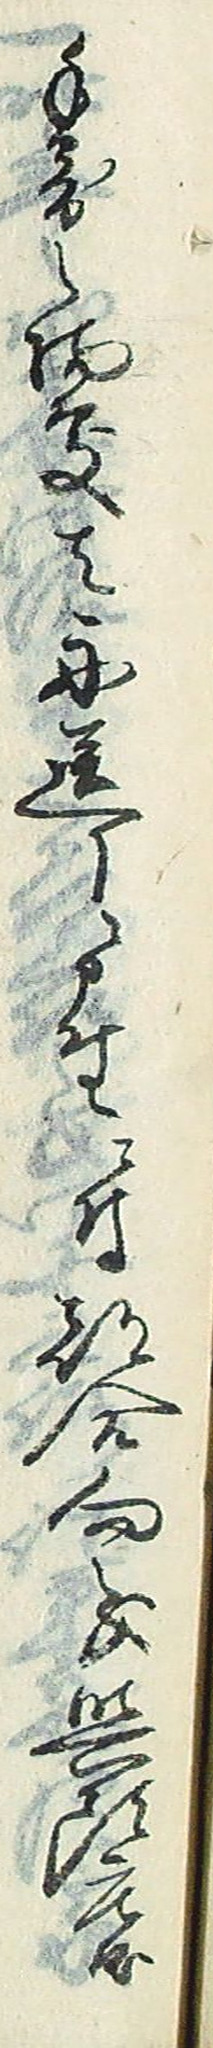手寄之場處者舟送りニ申付候ニ付都合向之義與頭庄屋
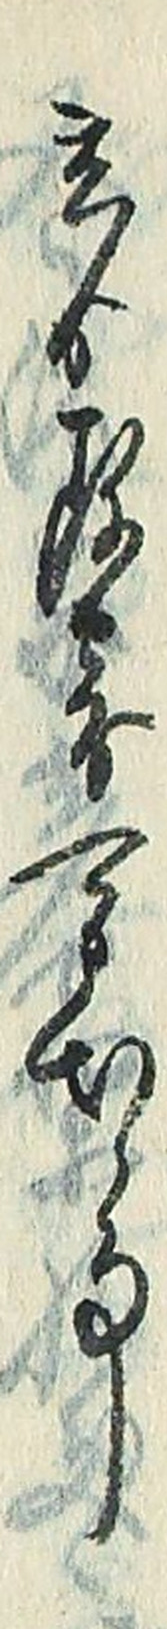共ゟ存寄可申出候事
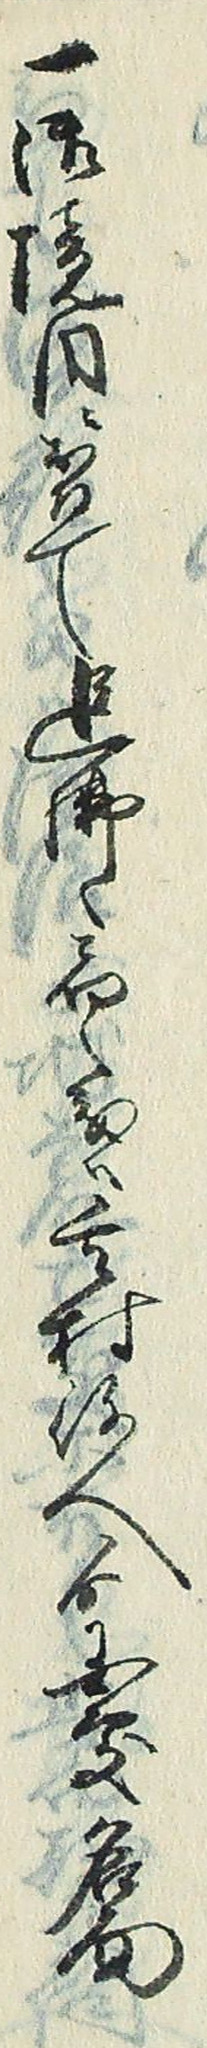一御境目ニおゐて追拂之者之義ハ其村役人ゟ国處名面
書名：諸御趣意書并御下知向之写
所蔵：鳴門教育大学 Naruto University of Education
